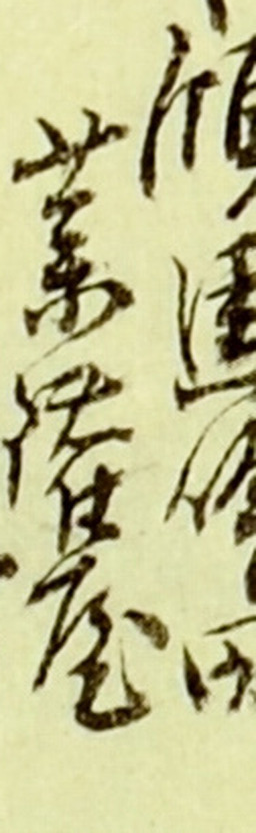薬鑵屋

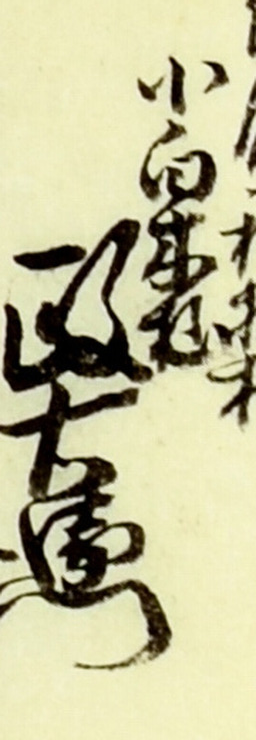政右衛門
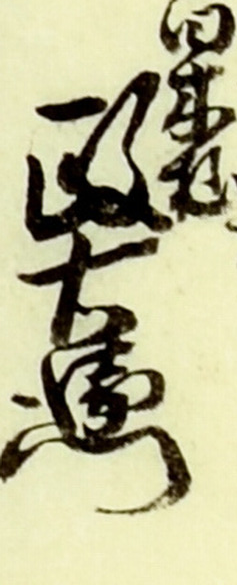政右衛門
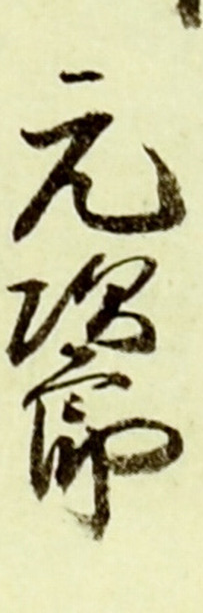岩次郎
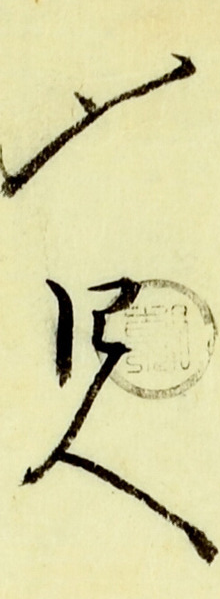〆四人
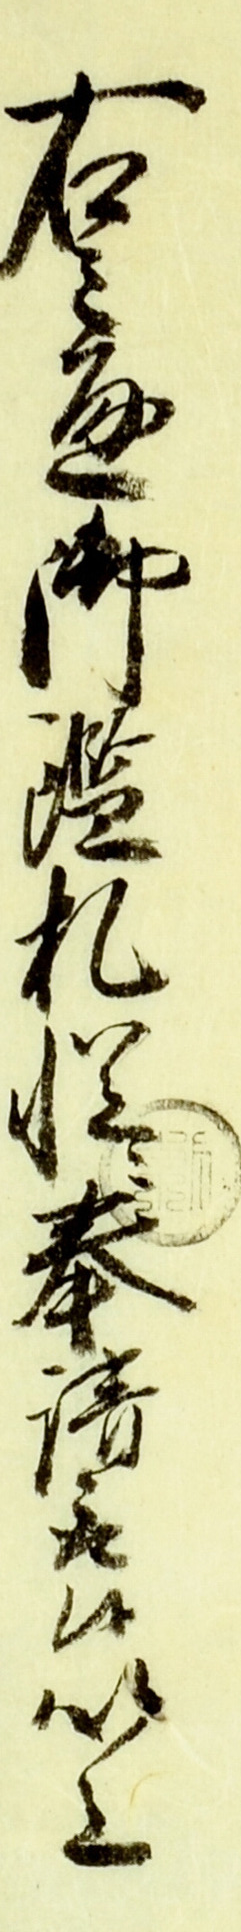右之通御鑑札慥奉請取候以上
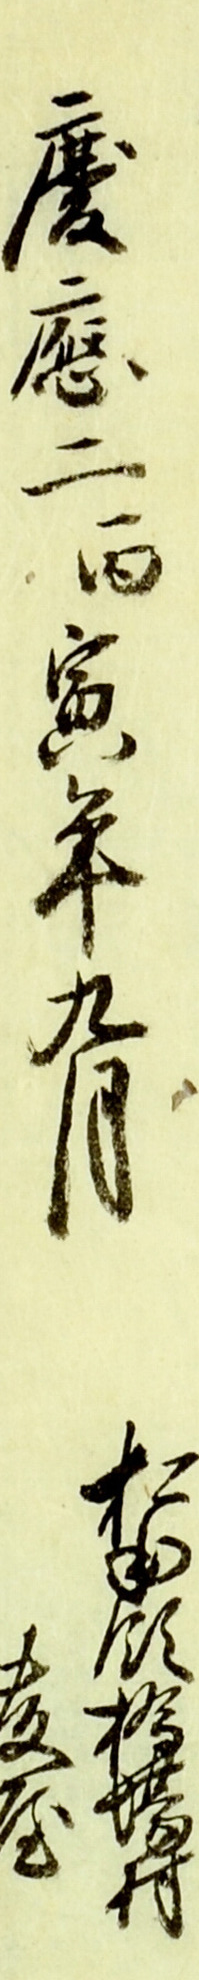慶応二丙寅年九月松本領橋場村
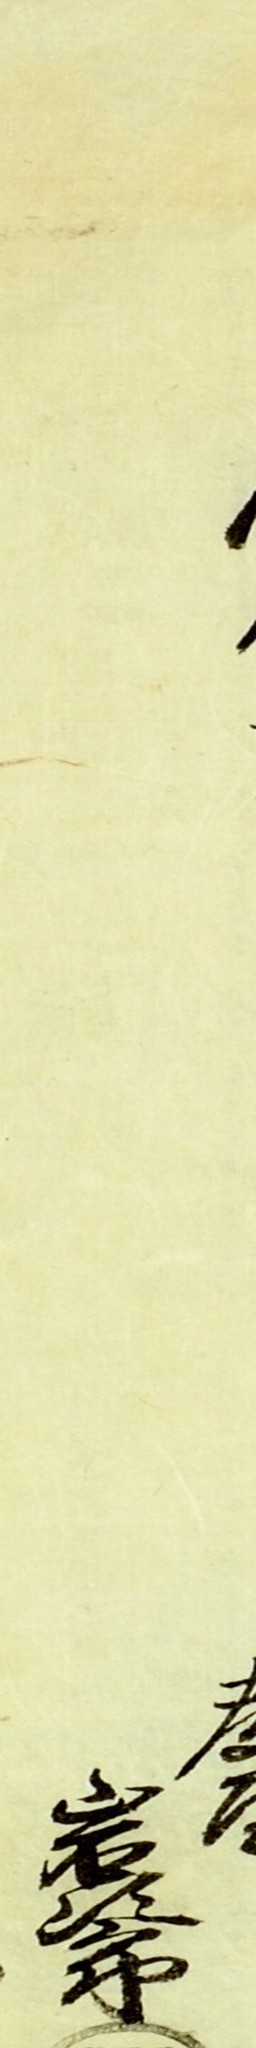岩次郎
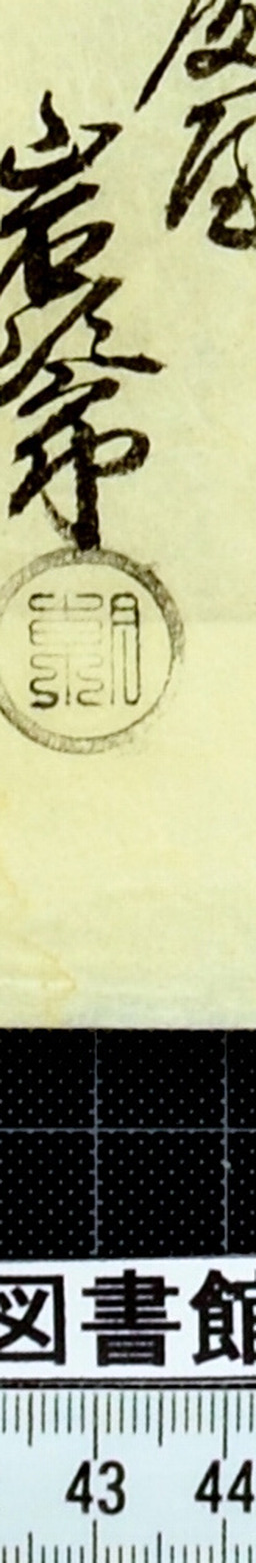岩次郎
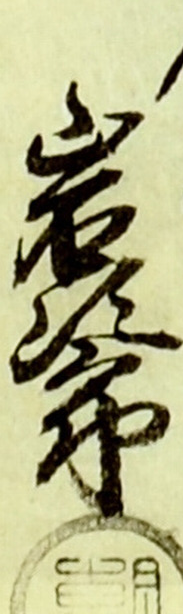岩次郎
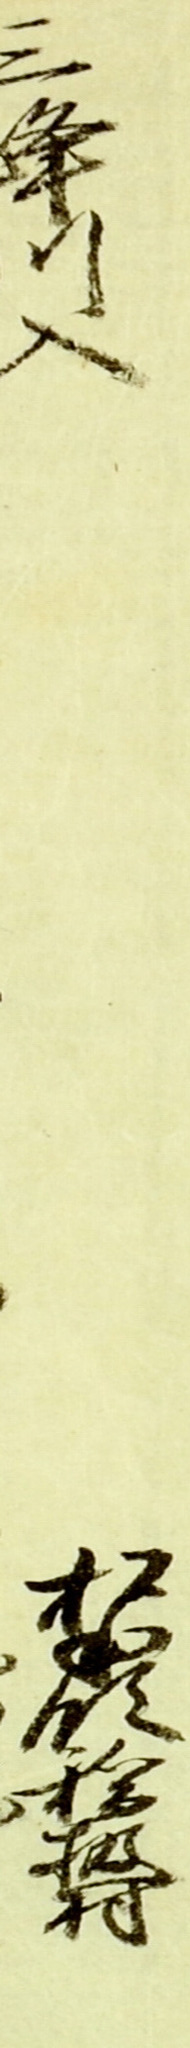三峰川入松本領稲扱村
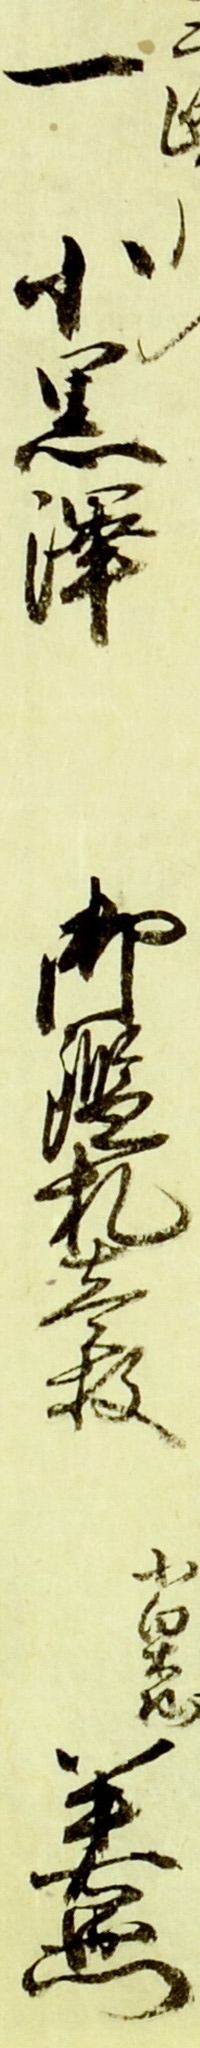一小黒沢御鑑札壱枚小白木杣

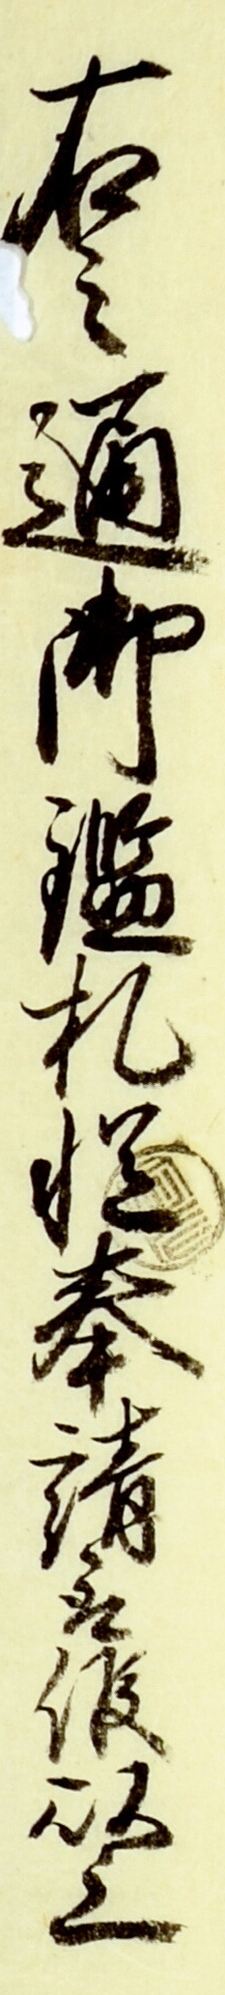右之通御鑑札慥奉請取候以上
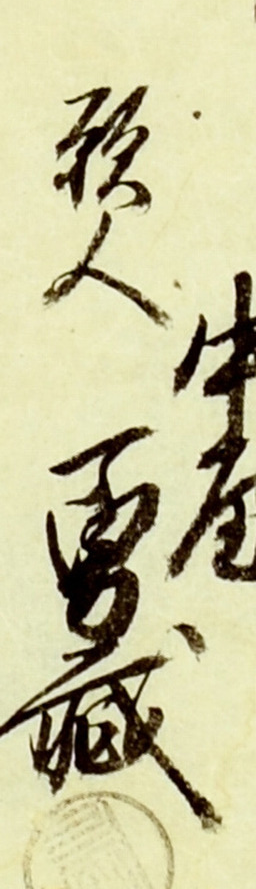願人勇蔵
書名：小白木條目請書并判取帳
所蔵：伊那市立高遠町図書館・合同会社AMANE
